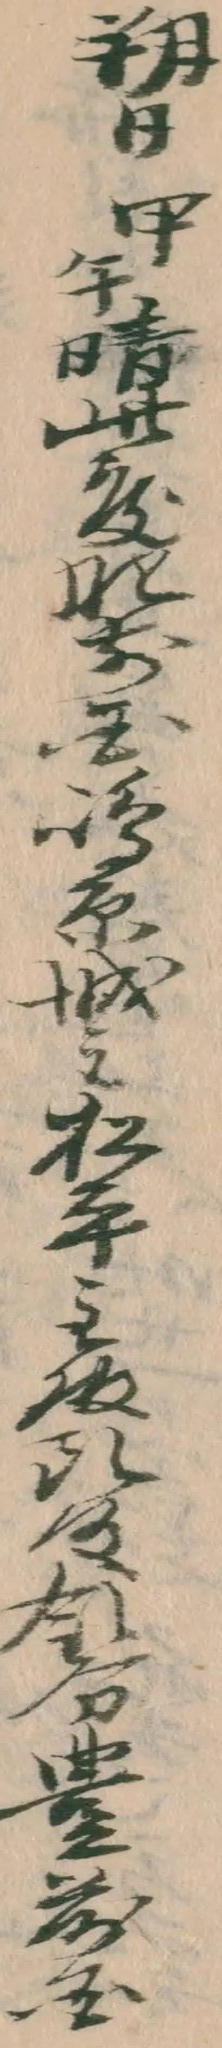朔日甲午晴此度肥前国嶋原城主松平主殿頭殿領分豊前国
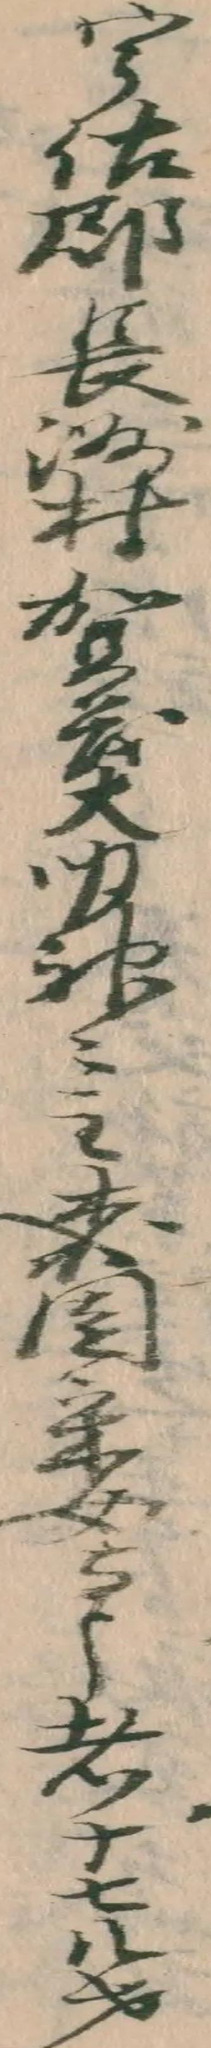宇佐郡長崎村賀茂大明神々主森岡采女と申者十七八才
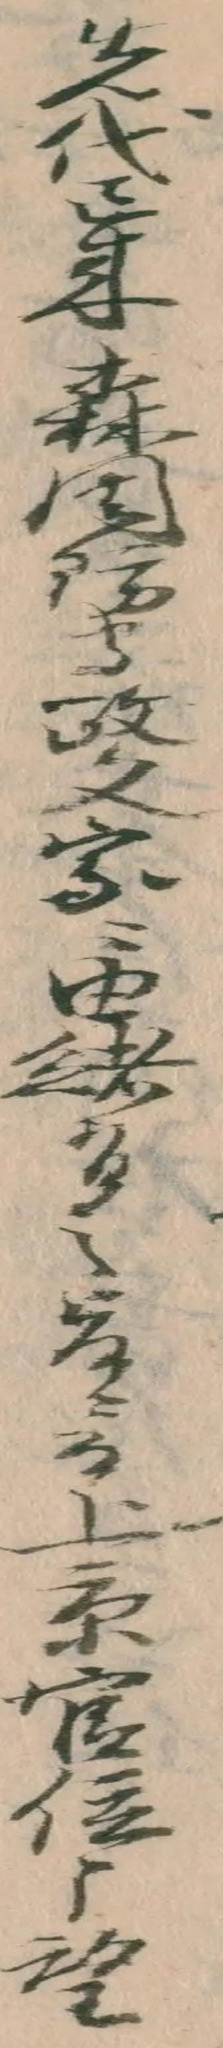先代已来森周防守政久家ニ由緒有之旨ニ而上京官位申望
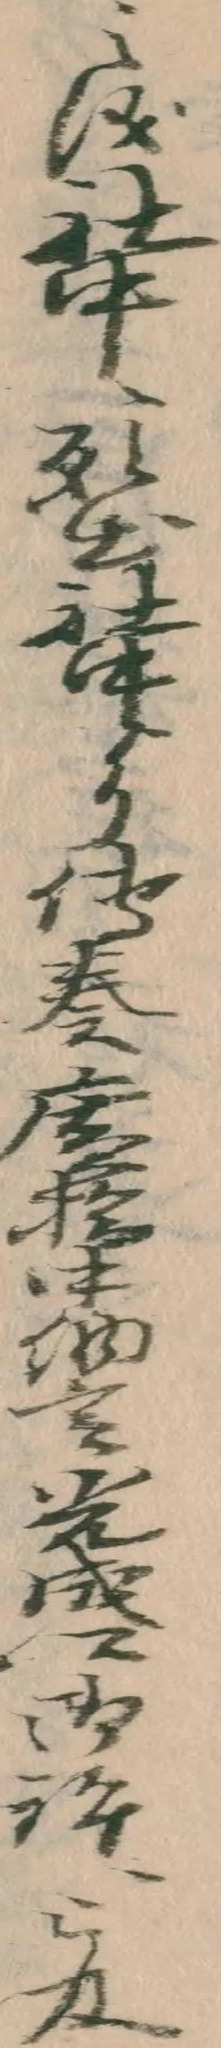之儀社中へ願出社中より傳奏廣橋中納言光成卿御許へ被及
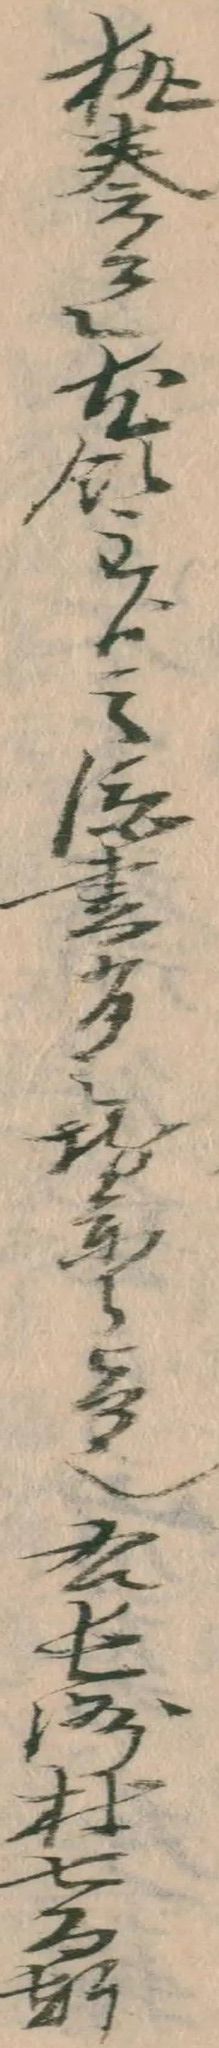執奏云々尤領主ゟ之添書有之持参之旨也右長州村七百軒
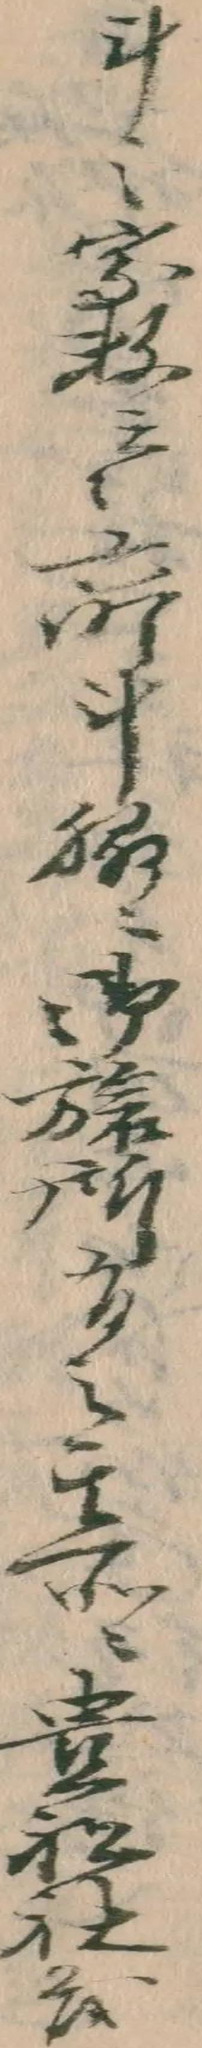斗之家数云々六町斗脇に御旅所有之其所に貴舩社も
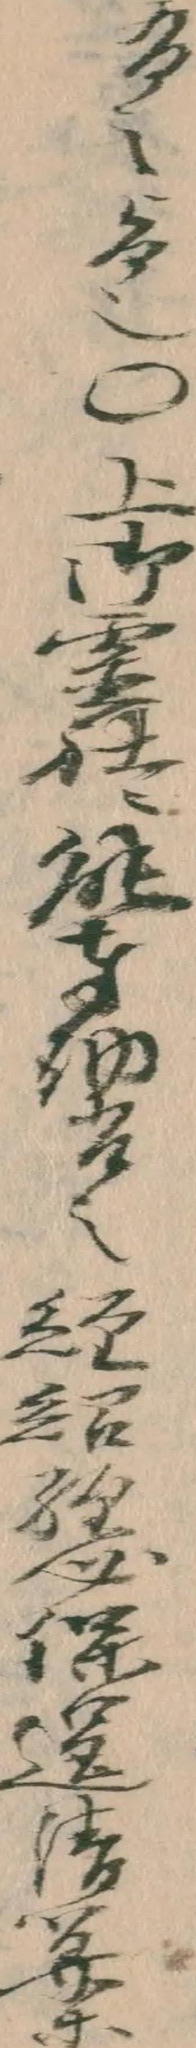有之旨也○上御霊社へ能奉納有之経紹経必保逞清算等
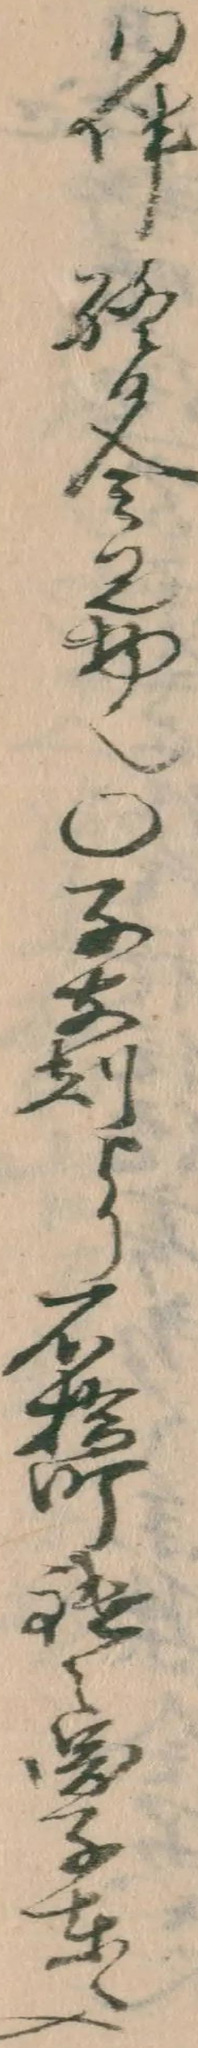同伴終日令見物也○子前刻より石橋町鑓之図子東へ入
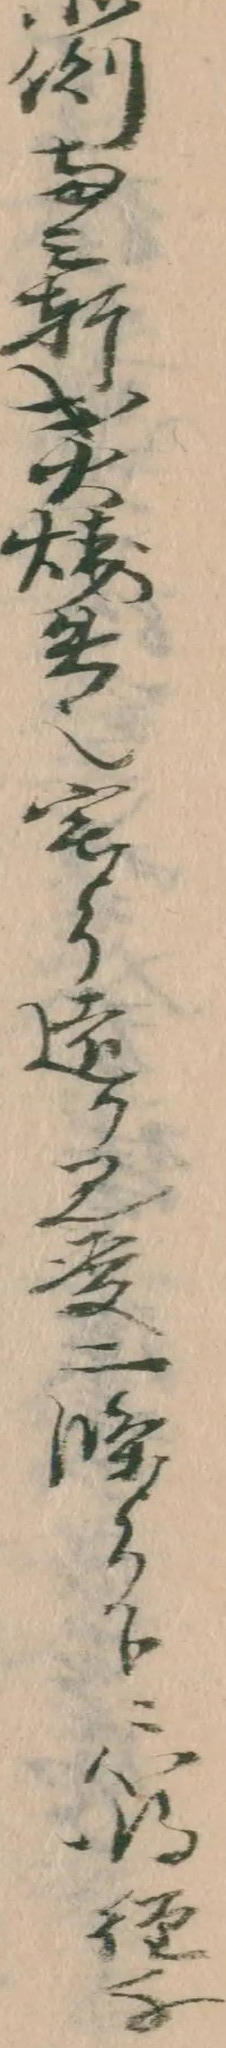北側両三軒出火焼失也宅より遠ク見受二條より下二心得経千
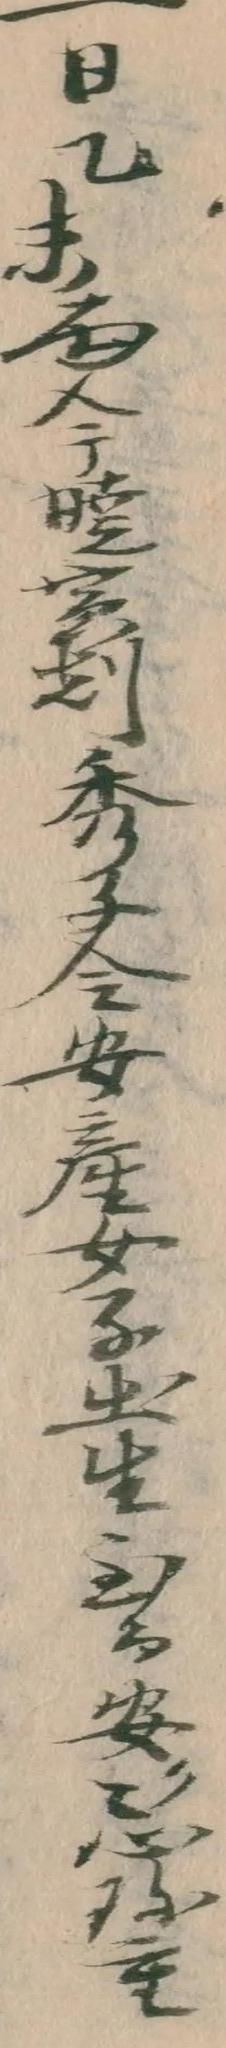二日乙未雨今暁寅刻秀子令安産女子出生至而安々々心珍重
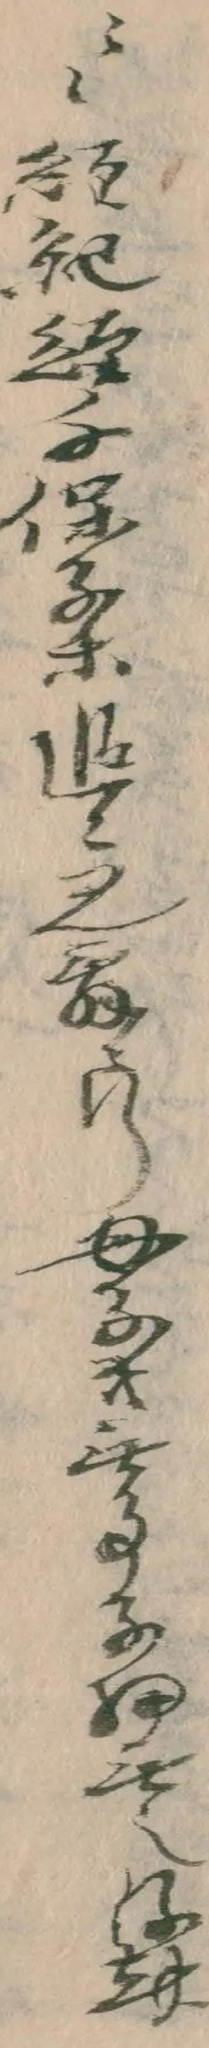々々経紀経千保子等追々見舞に行母子共無事子細無之
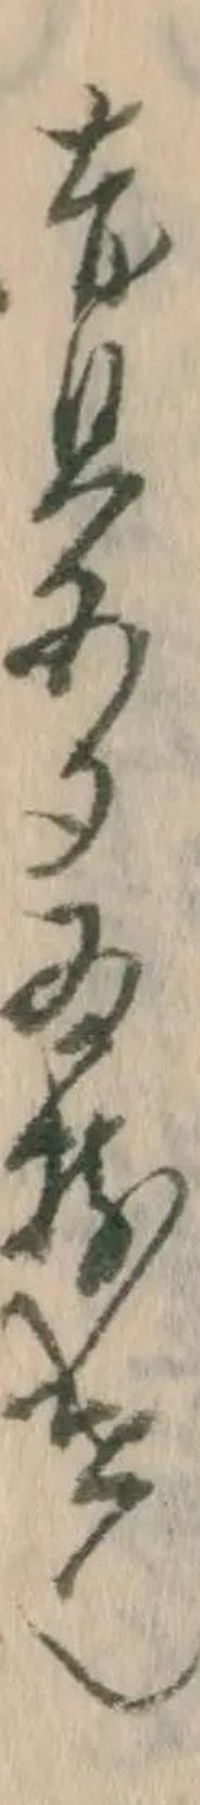赤貝五夕為持遣也
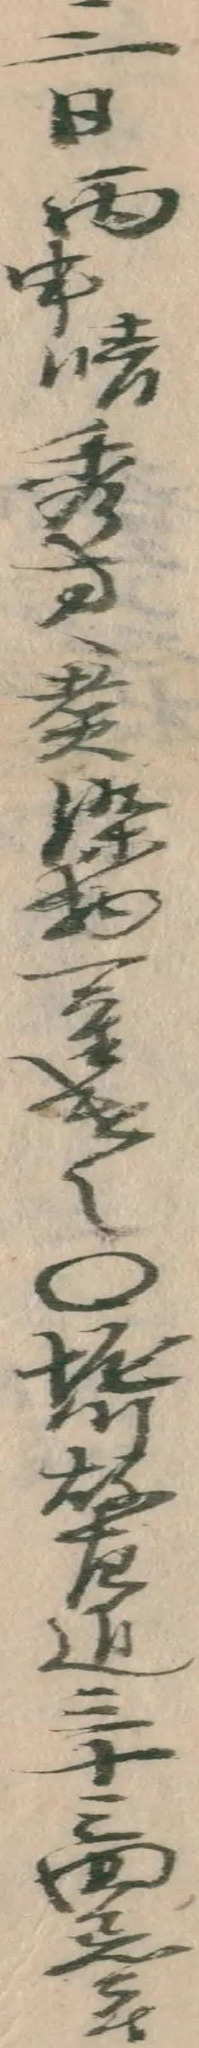三日丙申晴秀方へ煮染物一遣也〇堀川故左近辺三十三回忌ニ付
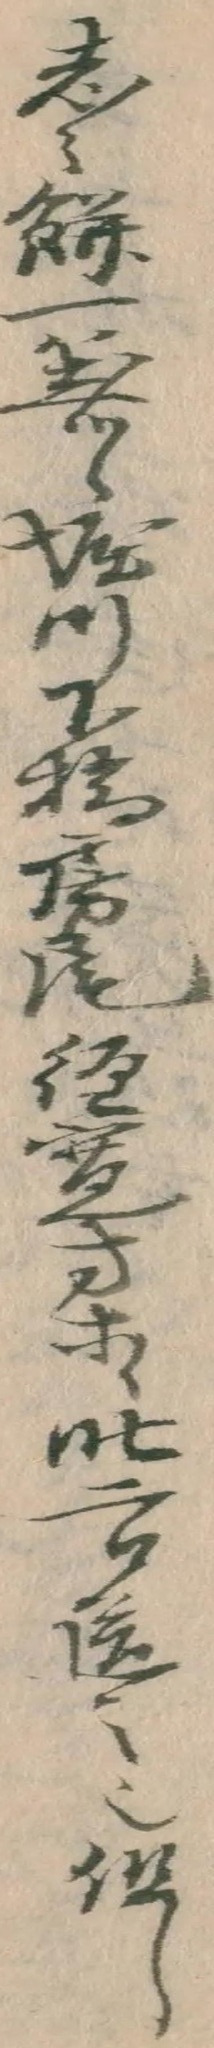志之餅一箱ツヽ堀川下橋房尾経寛方等へ昨二日逗之也但し
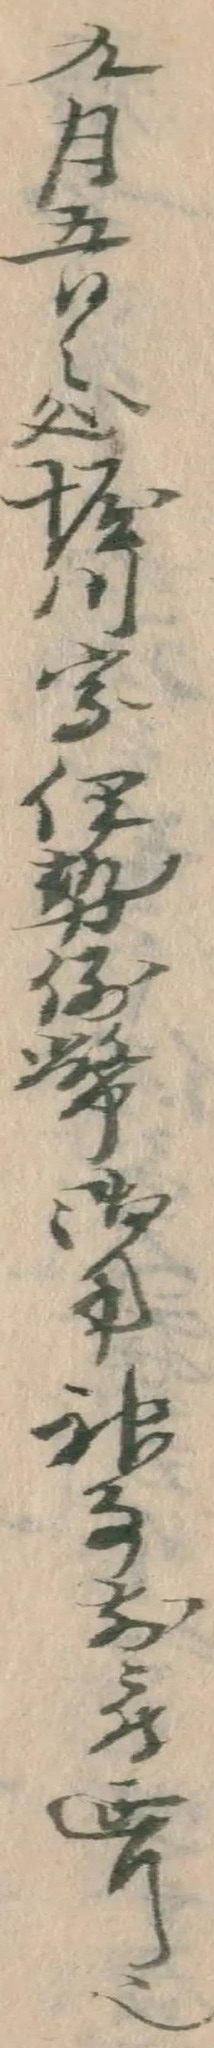九月五日之処堀川家伊勢例幣御用神事前ニ付延引也
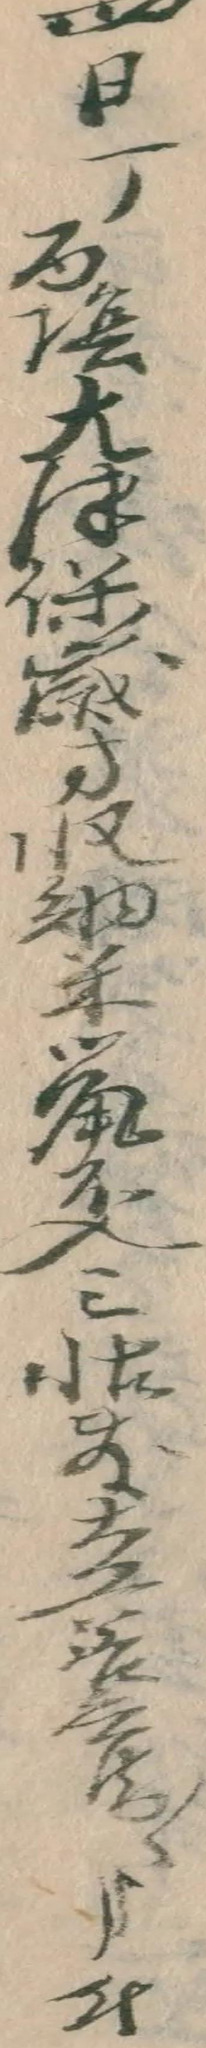四日丁酉陰大津保歳方収納米鼠不入三帖敷大工管無衛へ申付
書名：賀茂社記録. 第69冊
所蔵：国立国会図書館 National Diet Library, JAPAN
